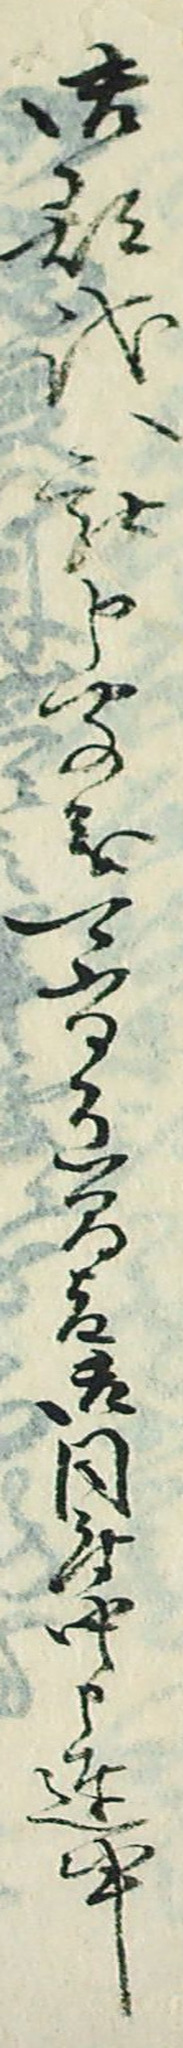御郡代へ被申聞義可有了簡旨御目付中申達事
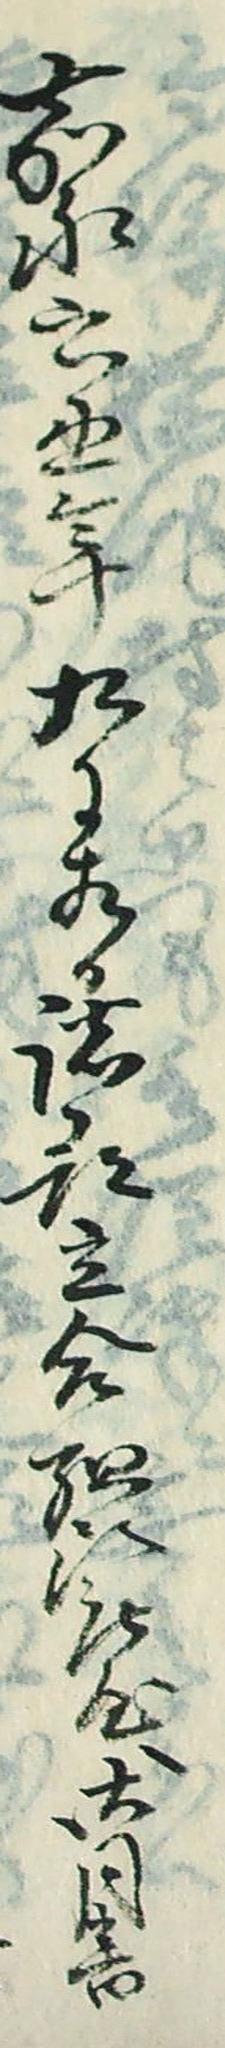嘉永六丑年九月十九日諸郡立合組頭庄屋へ御月番
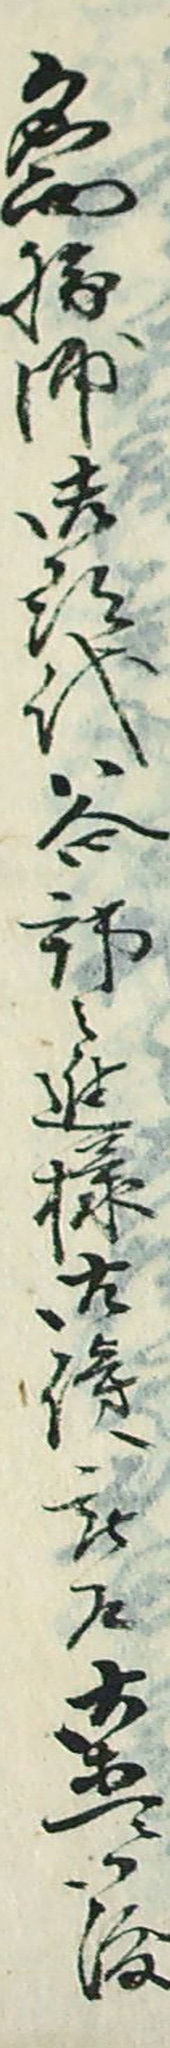名西勝浦御郡代谷邦之進様御傍へ被召御直ニ御渡
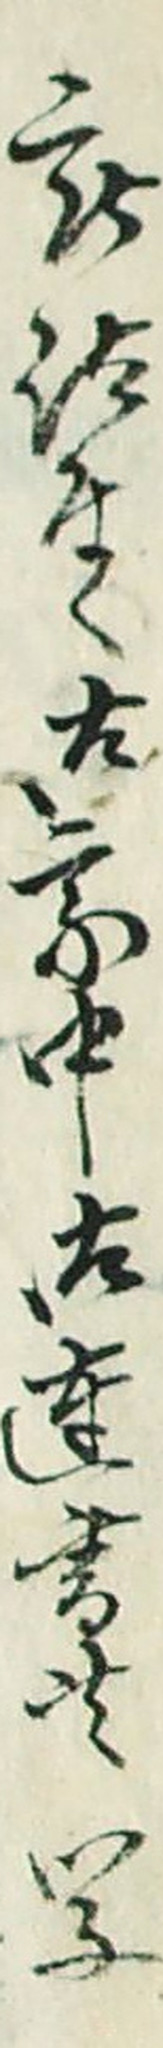被仰付候御家中御達書共写

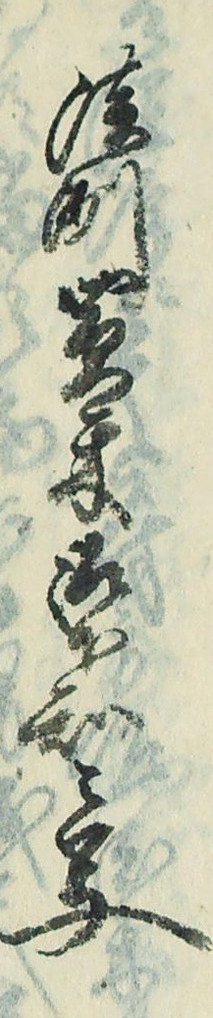淡州買米御下知之写
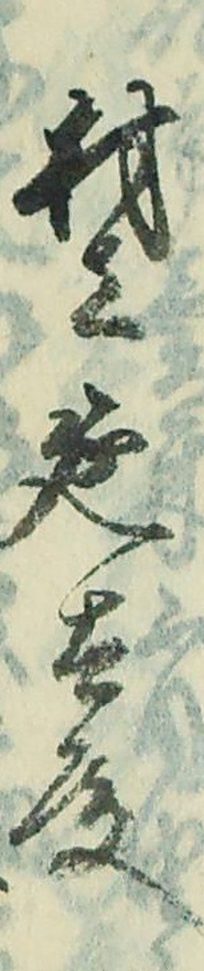村上延太殿
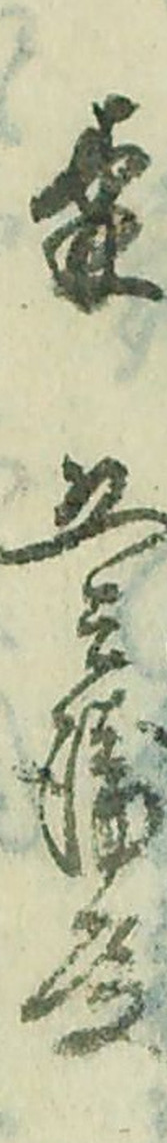森五兵衛殿
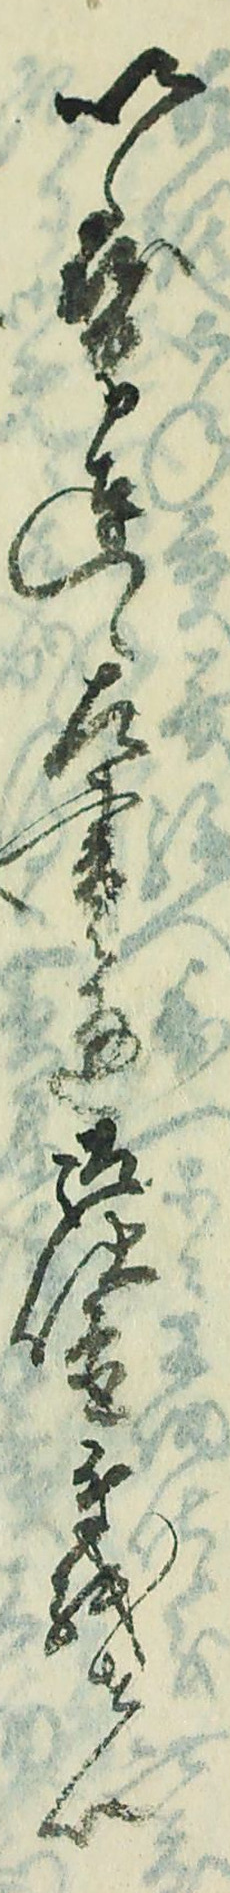以帋申達候左書之通御仕置付紙を以
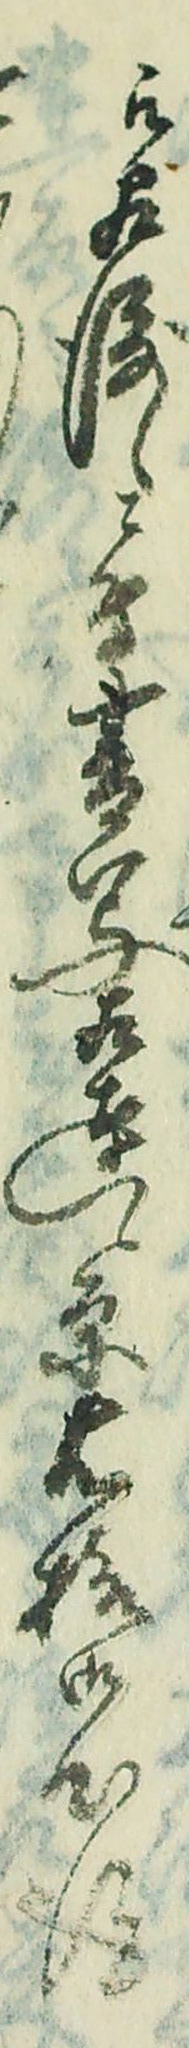被相渡候ニ付書写相達候条右様相心得
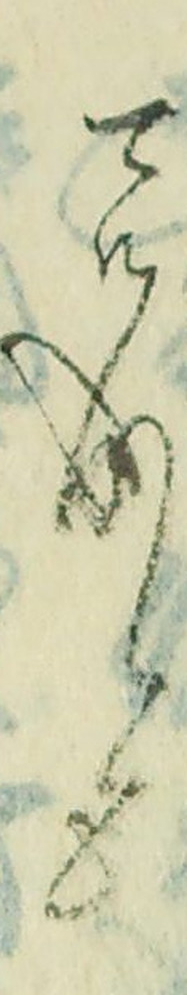可被成候以上
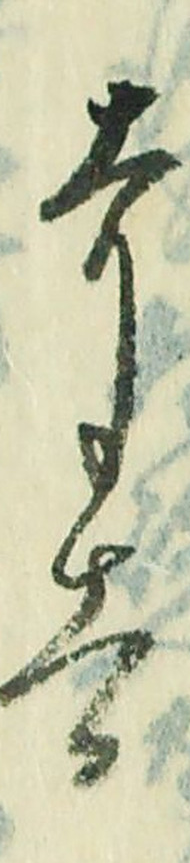十一月十一日
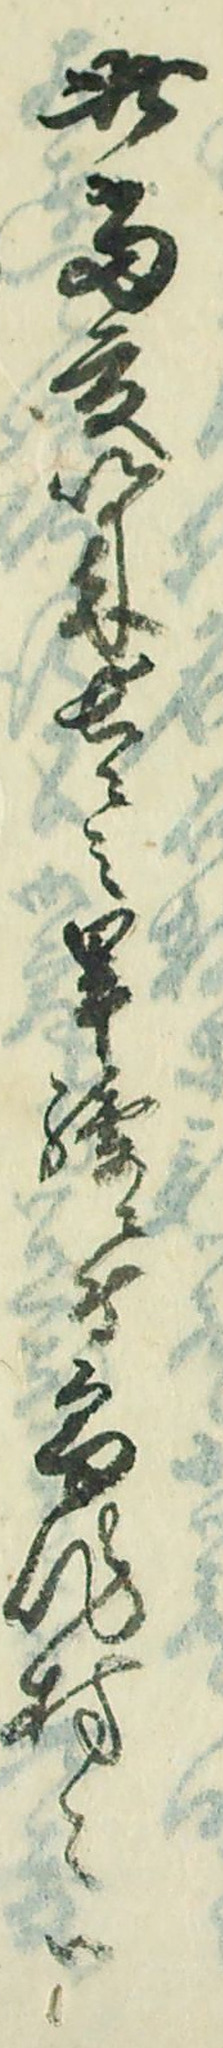此當夏以来長々之旱續ニ付畠作村々ハ
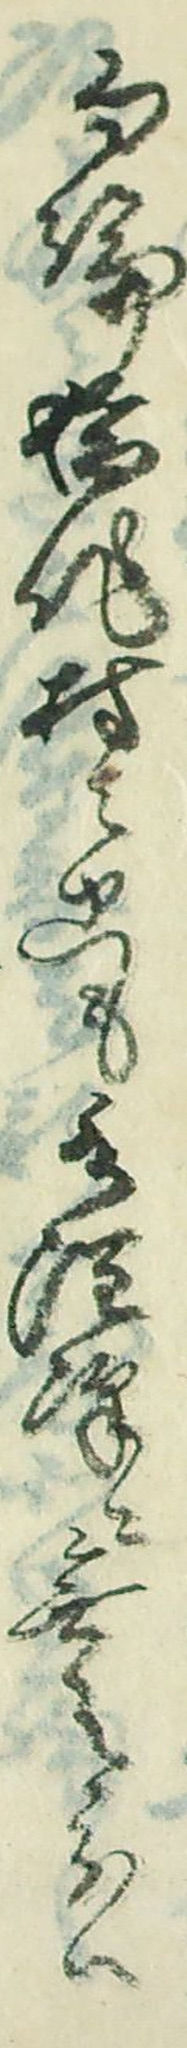勿論稲作村々迚も水潤澤ニ無之候分ハ
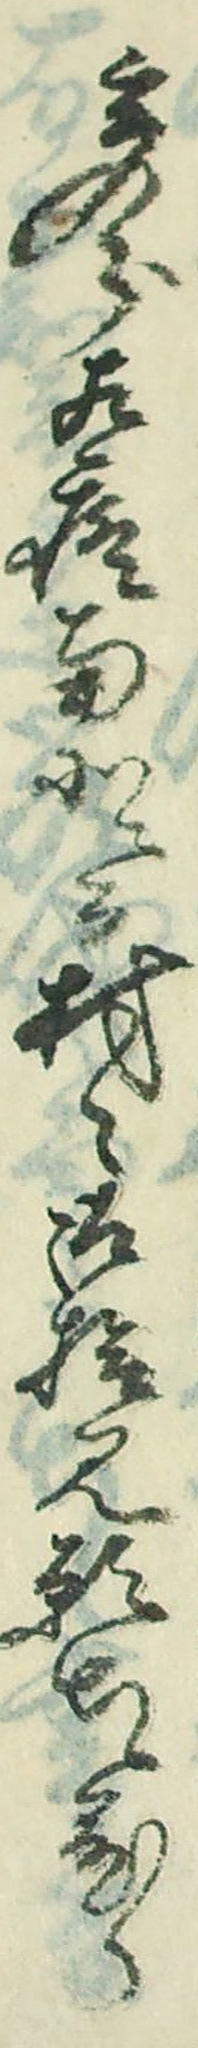多分相疼南北ニ而村々御検見願出候懸り

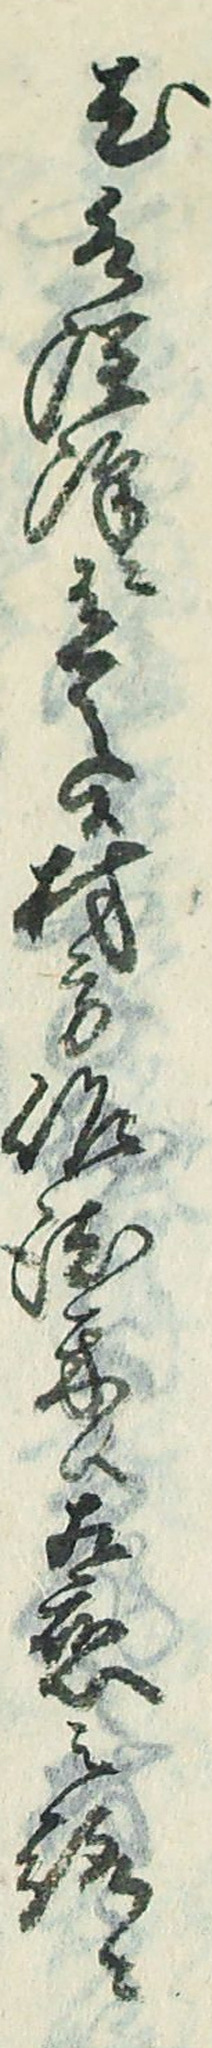尤水潤澤ニ有之候村方作徳米ハ相應之趣ニ
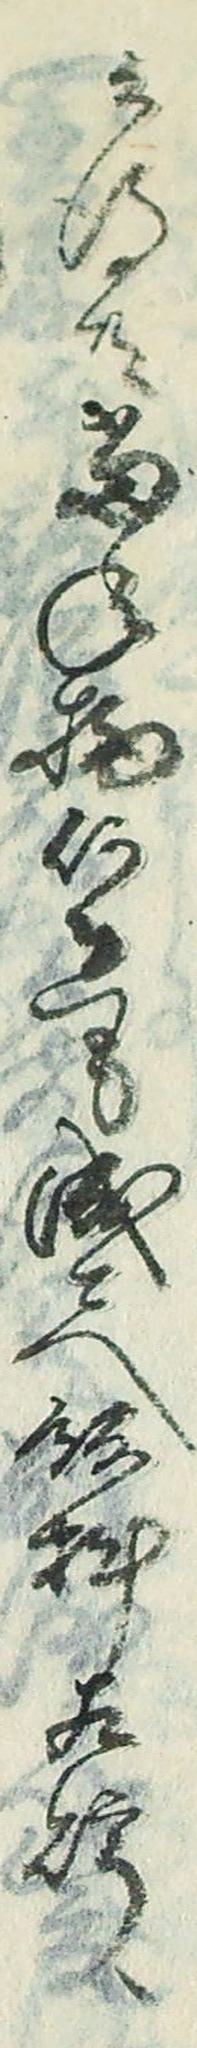候得共當年柄何れも減尺飯料相貯候
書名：諸御趣意書并御下知向之写
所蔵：鳴門教育大学 Naruto University of Education
